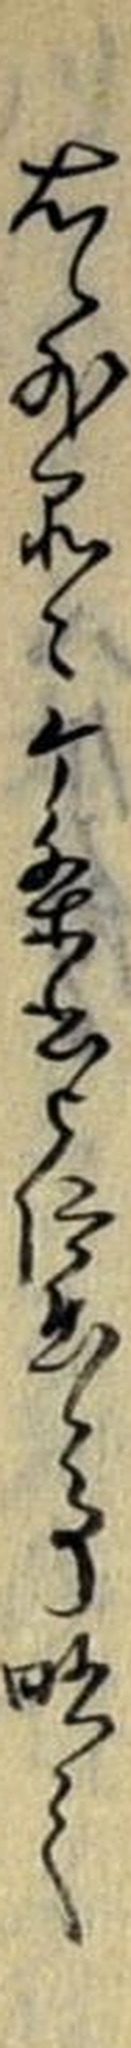右之外品々ケ条書被仰出候事略之
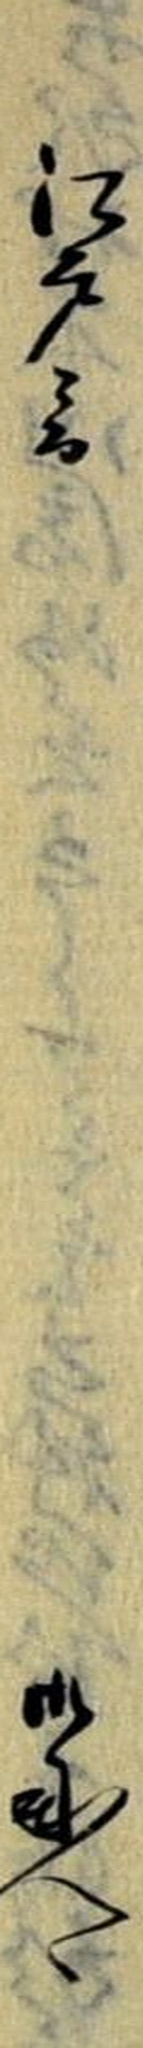江戸ニ而御用人へ
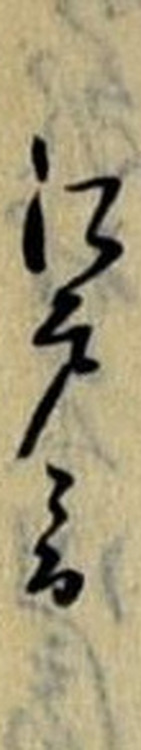江戸ニ而
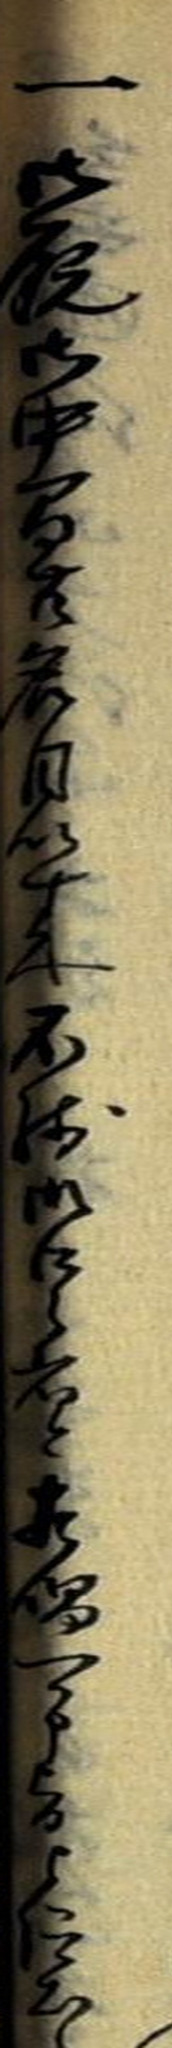一御厩御中間共名目以来不残御口之者と相唱可申旨被仰出候
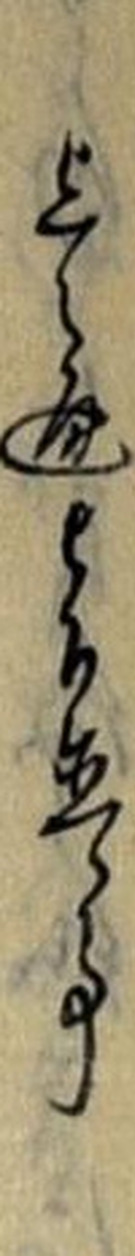迄之通被下置候事
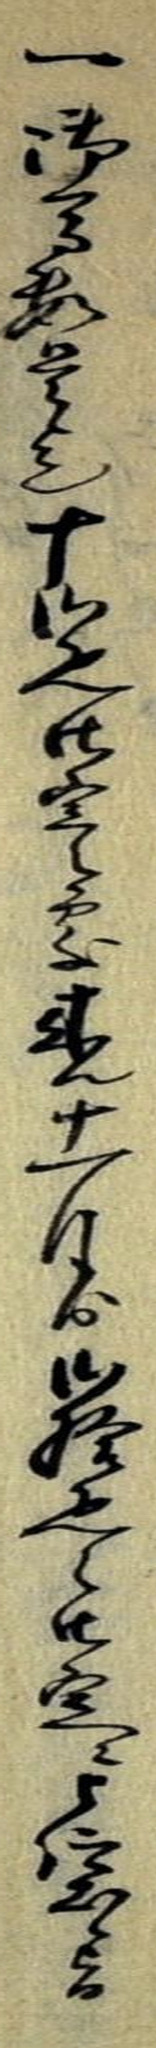一御馬数是迄十弐疋御定之処来ル十一月ゟ弐拾疋之御定ニ被仰出候旨
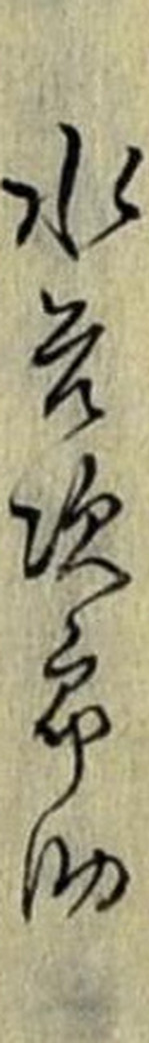水谷次郎助
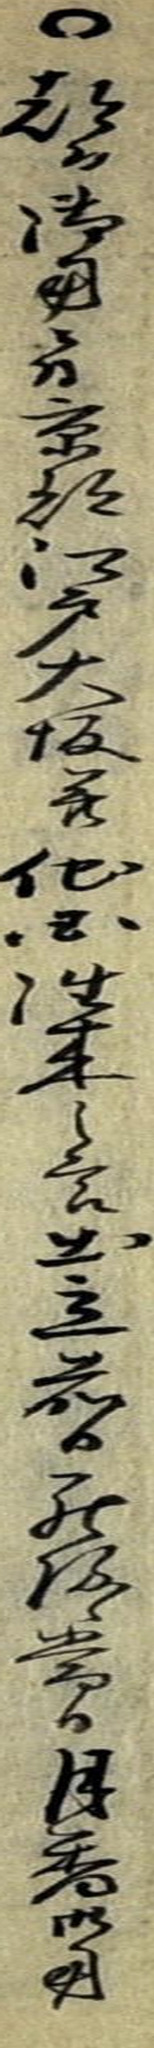〇都而御用ニ付京都江戸大坂并他国往来之節出立前日罷帰候当日月番御用
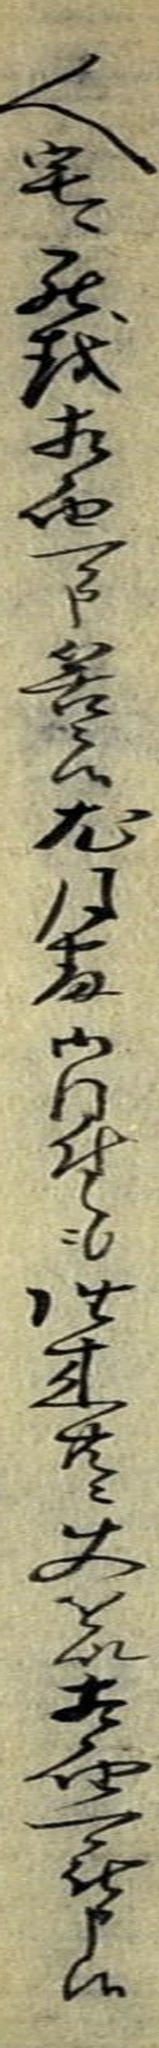人宅へ罷越相届可申筈ニ候尤月番御目付へも往来共ニ使を以相届可被申候
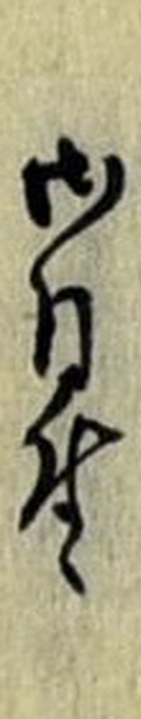御目付へ
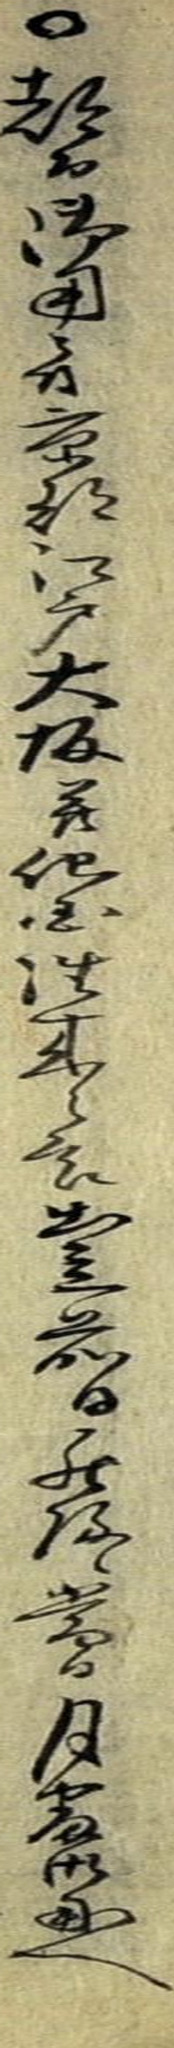〇都而御用ニ付京都江戸大坂并他国往来之節出立前日罷帰候当日月番御用
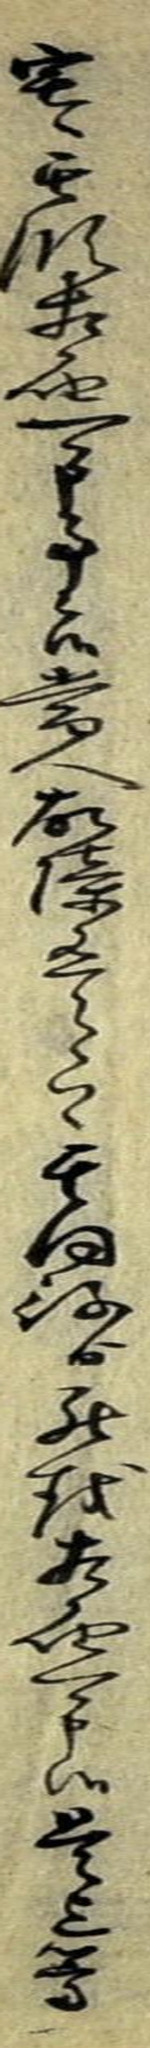宅へ其段相届可申事ニ候当人故障有之候ハヽ其同役ゟ罷越相届可申候是迄等
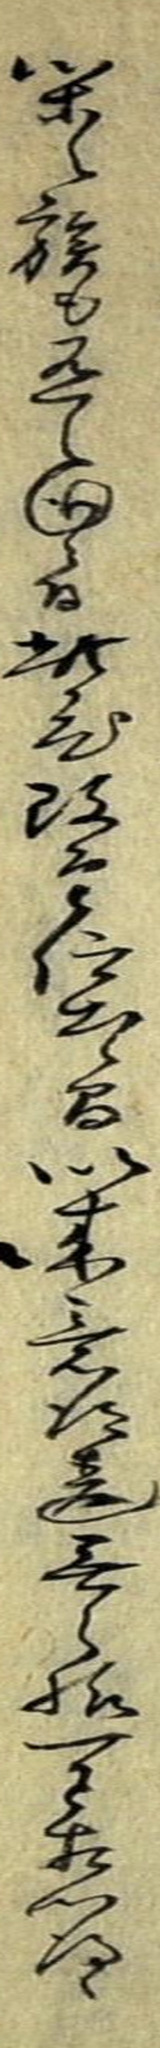閑之族も有之趣ニ付此度改而被仰出候間以来意得違無之様可被相心得候
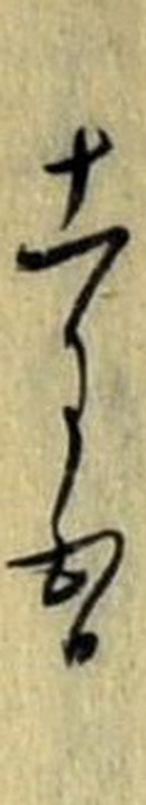十一月五日

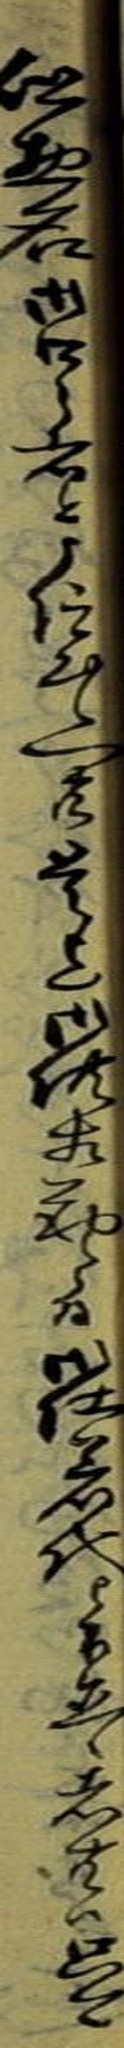但惣名御口之者と被仰出候へ共是迄御供相勤候ニ付御仕着代被下置候者共ハ只今

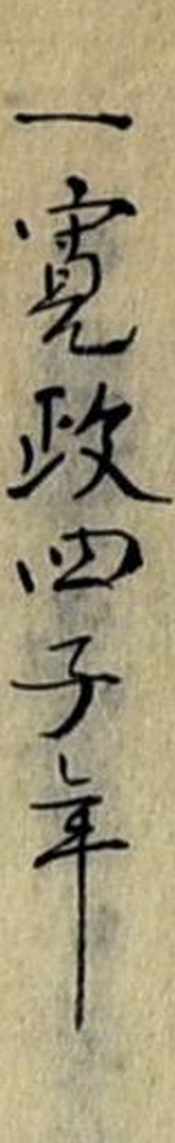一寛政四子年
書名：命令之部 三
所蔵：福井県文書館 Fukui Prefectural Archives
